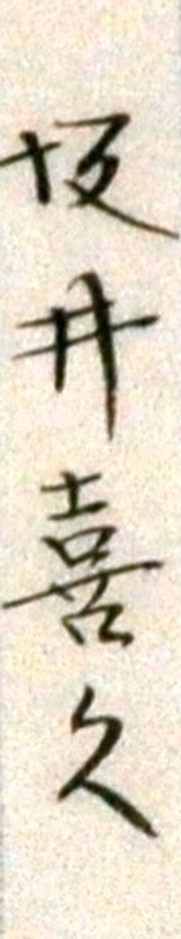坂井喜久
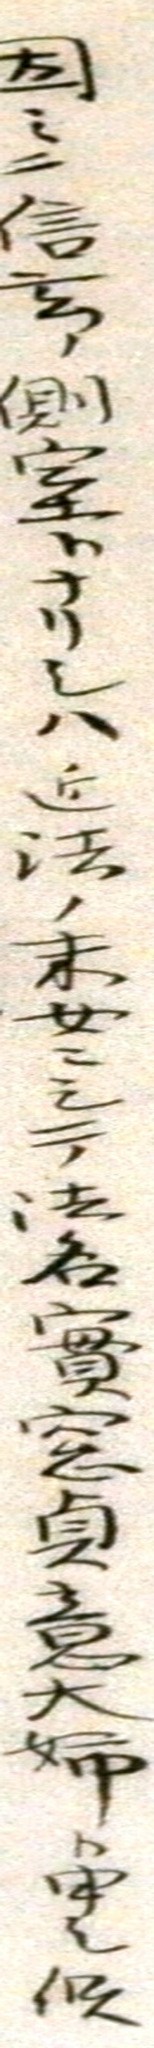因ミニ信玄ノ側室トナリシハ近法ノ末女ニシテ法名実窓貞意大姉ト申シ候
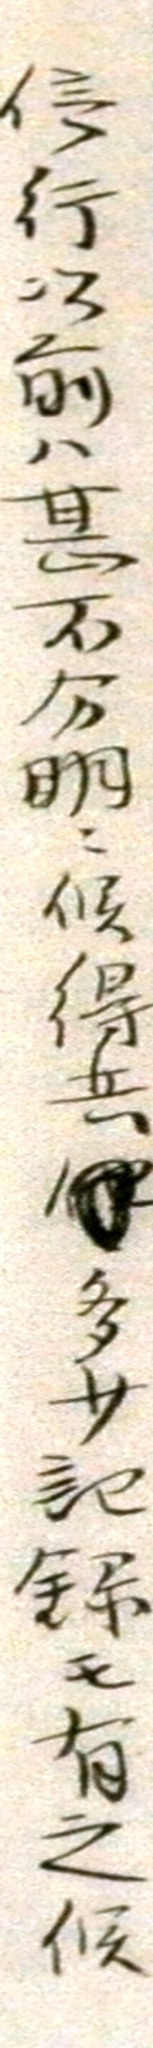信行以前ハ其不分明ニ候得共其後ハ多少記録モ有之候

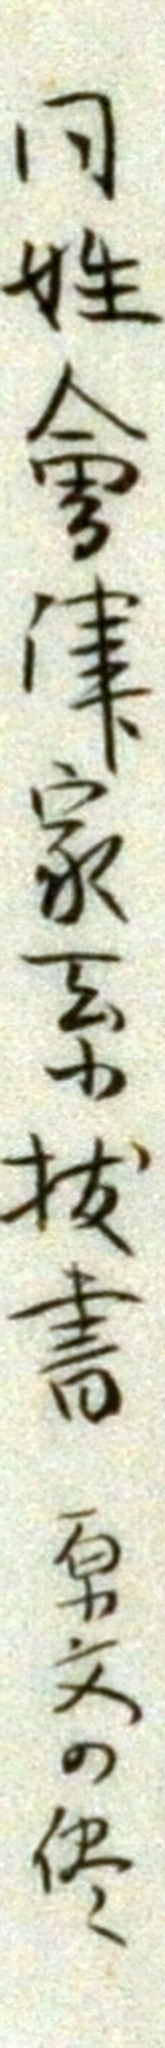同姓会津家系抜書原文の侭
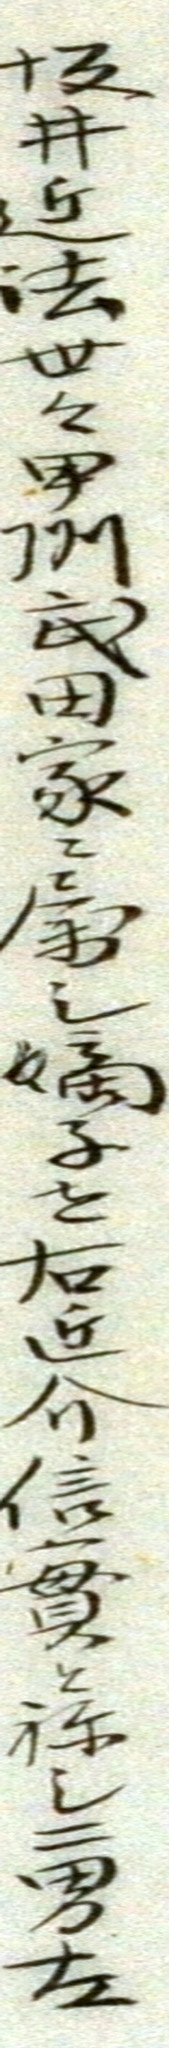坂井近法世々甲州武田家ニ属シ嫡子を右近介信実と称シ二男左
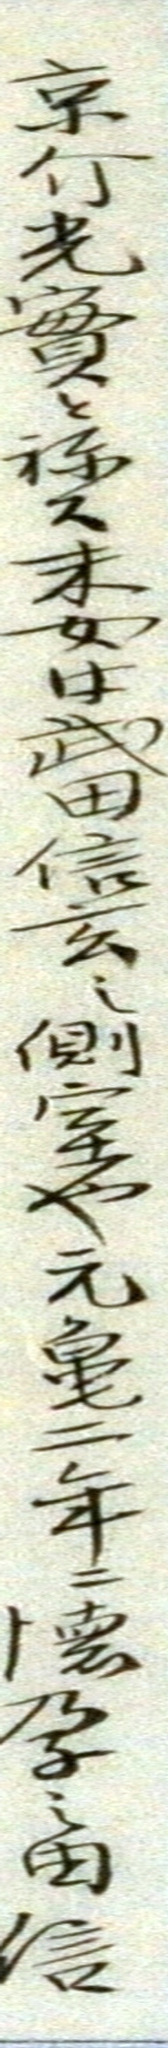京介光実と称ス末女は武田信玄之側室也元亀二年ニ懐孕之由信
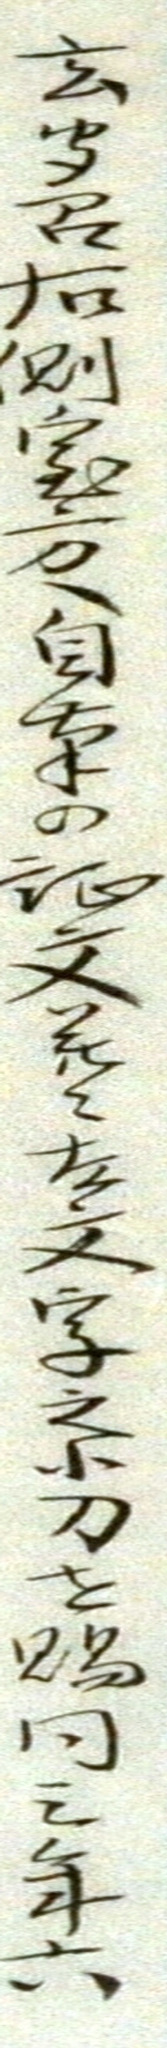玄聞召右側室方へ自筆の証文并ニ左文字之小刀を賜同三年六
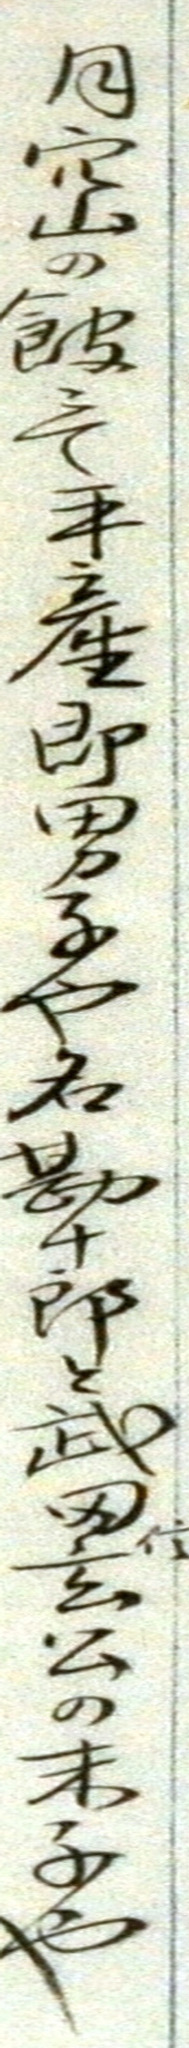月穴山の館ニて平産即男子也名勘十郎と武田信玄公の末子也
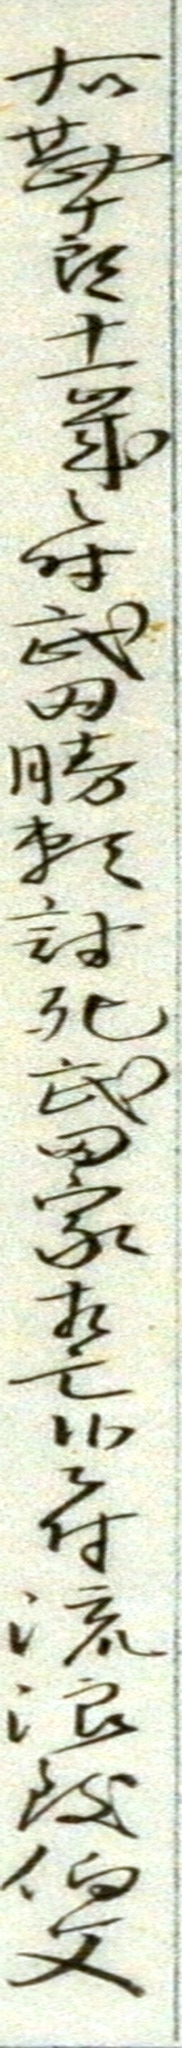右勘十郎十一歳之時武田勝頼討死武田家相亡候ニ付流浪致伯父
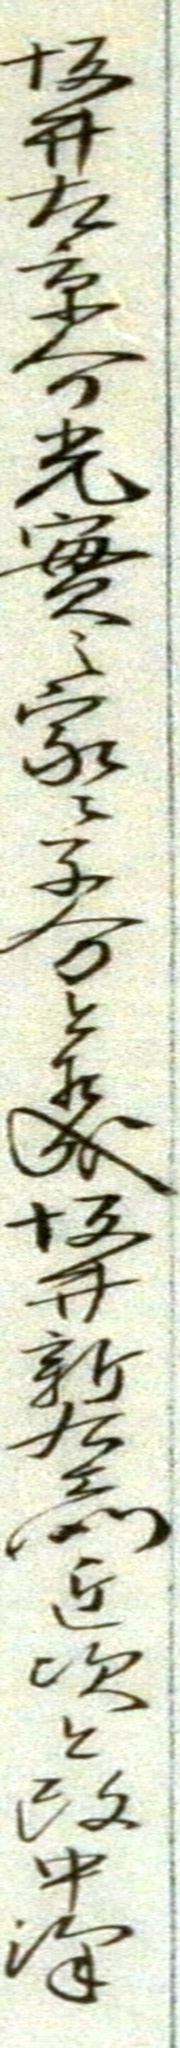坂井左京介光実之家ニ子分と相成坂井新左エ門近次と改中澤
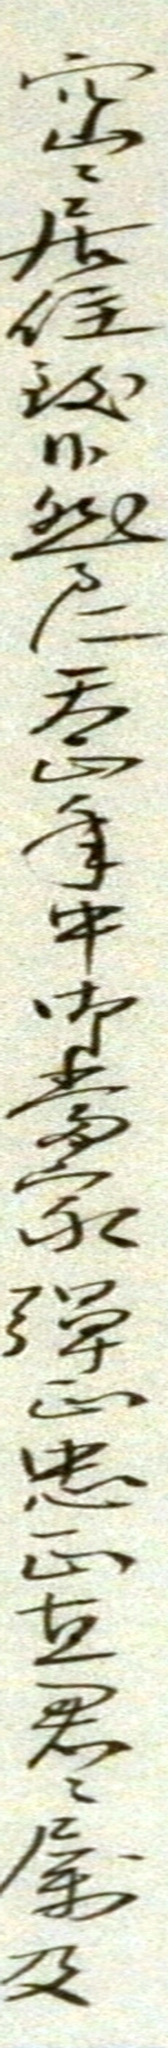穴山ニ居住致候然るに天正年中御当家弾正忠正直君ニ属及
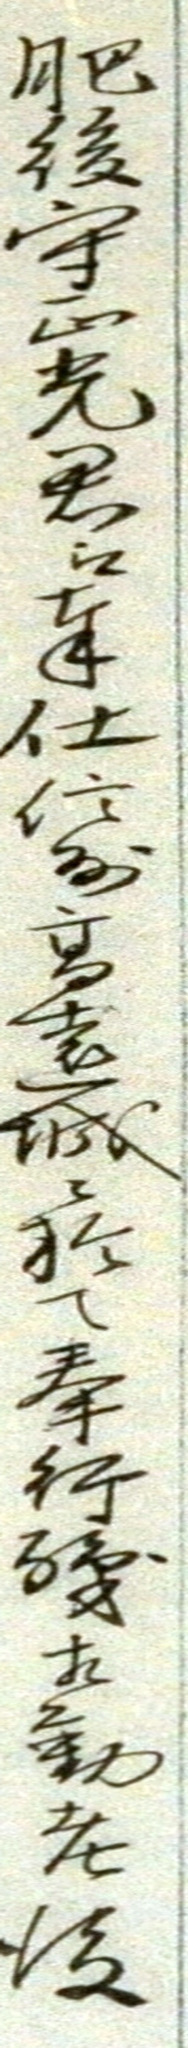肥後守忠光君江奉仕信州高遠城ニ於て奉行職相勤老後
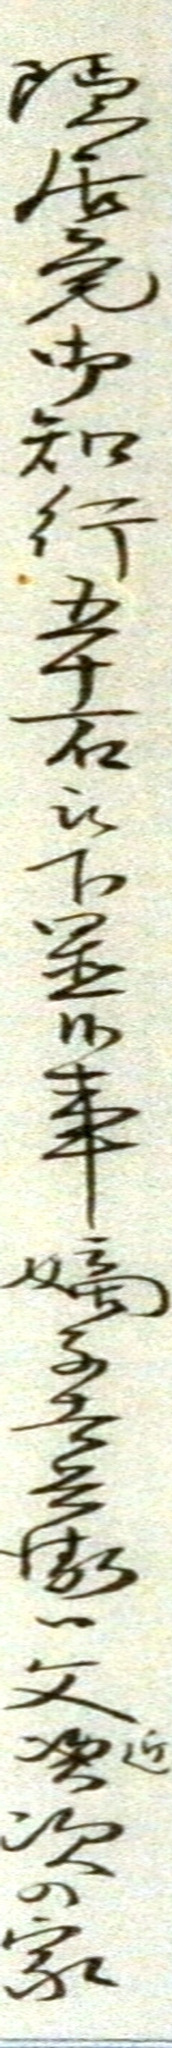隠居急御知行五十石被下置候事嫡子吉兵衛ハ父近次の家
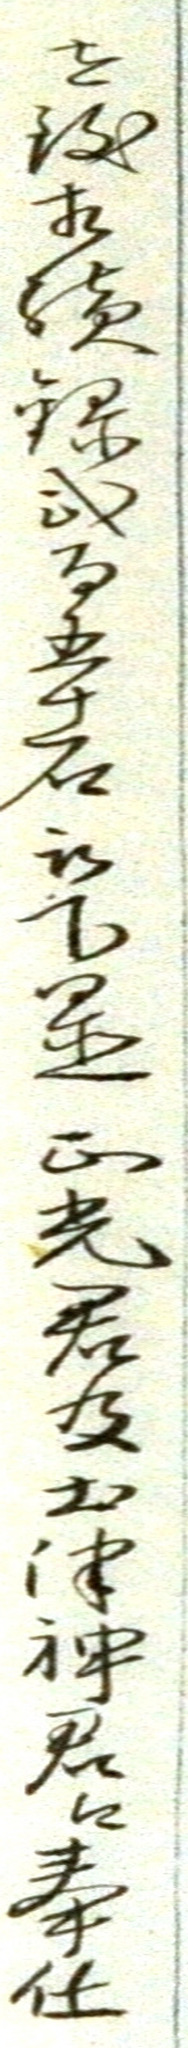を致相続録弐百五十石被下置忠光君及土津神君江奉仕

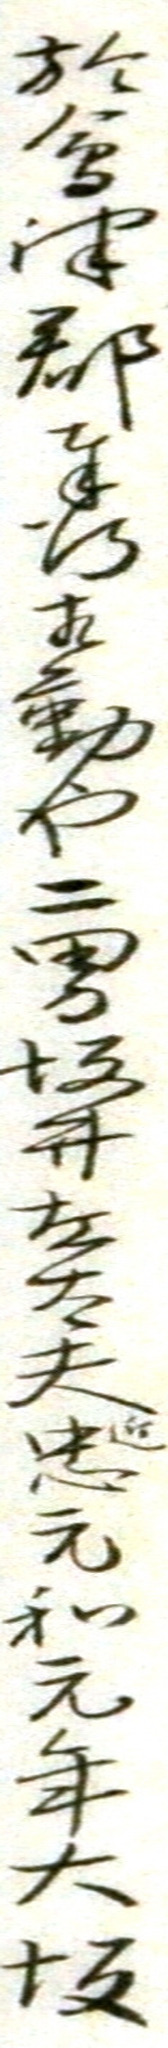於会津郡奉行相勤也二男坂井左太夫近忠元和元年大坂
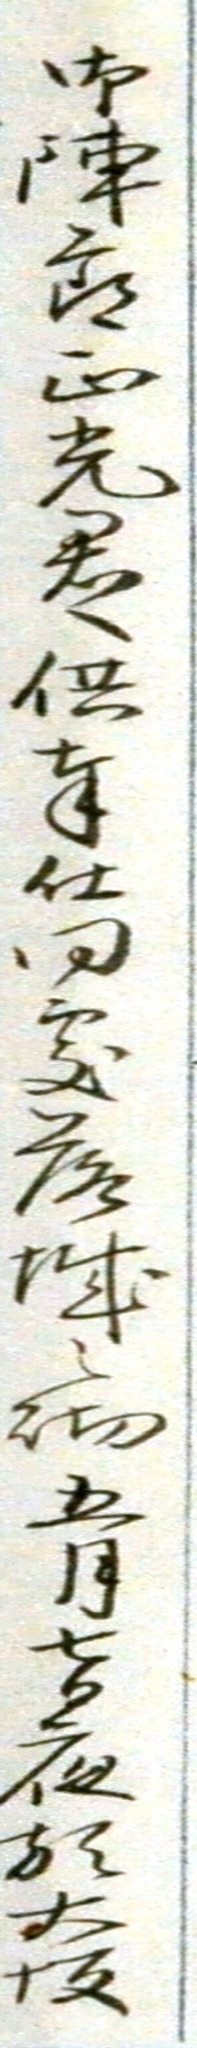御陣節正光君へ供奉仕同処落城之砌五月七日夜於大坂
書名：三好氏先代以来勤仕録、池田丈介一家勤仕録
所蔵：伊那市立高遠町図書館・合同会社AMANE
